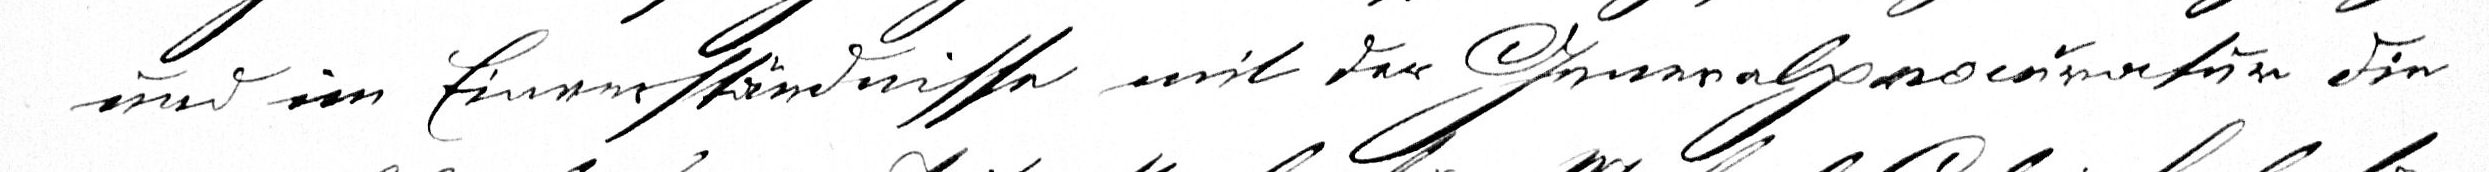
und im Einverständnisse mit der Generalprocuratur die
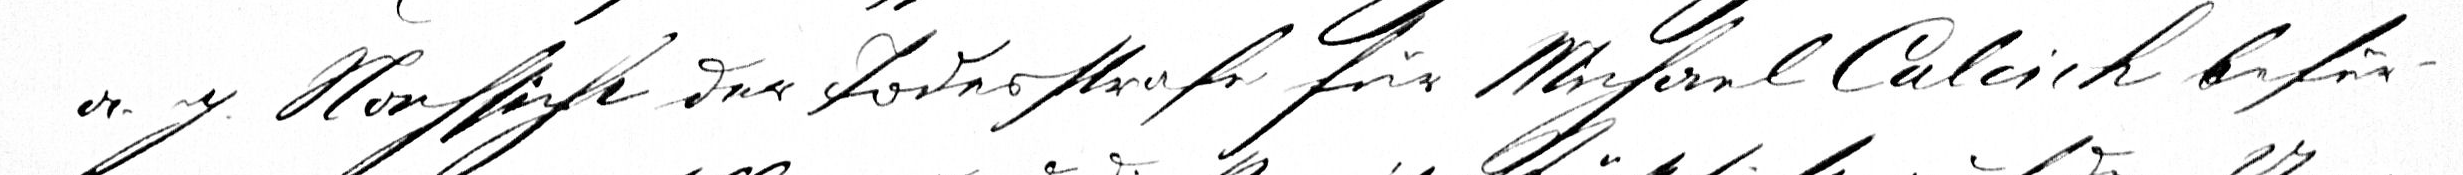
a. g. Nachsicht der Todesstrafe für Michael Calcich befür¬
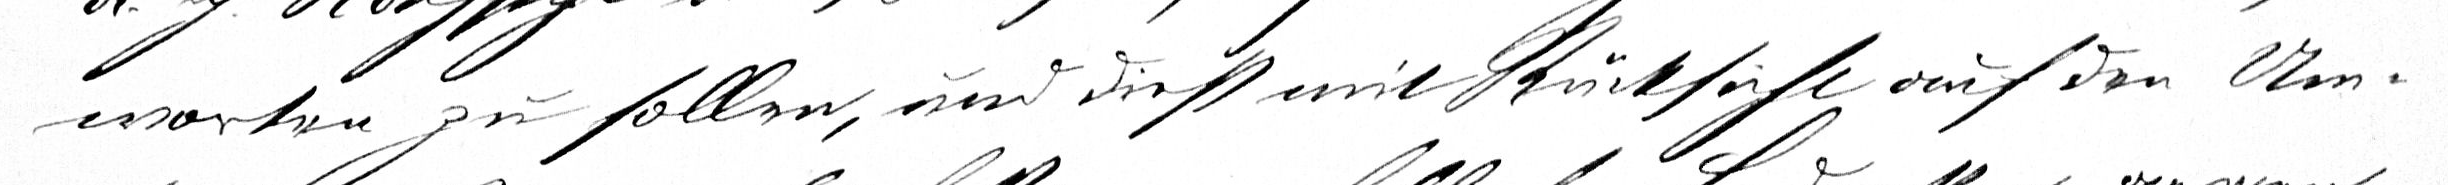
worten zu sollen, und dieß mit Rücksicht auf der Um¬
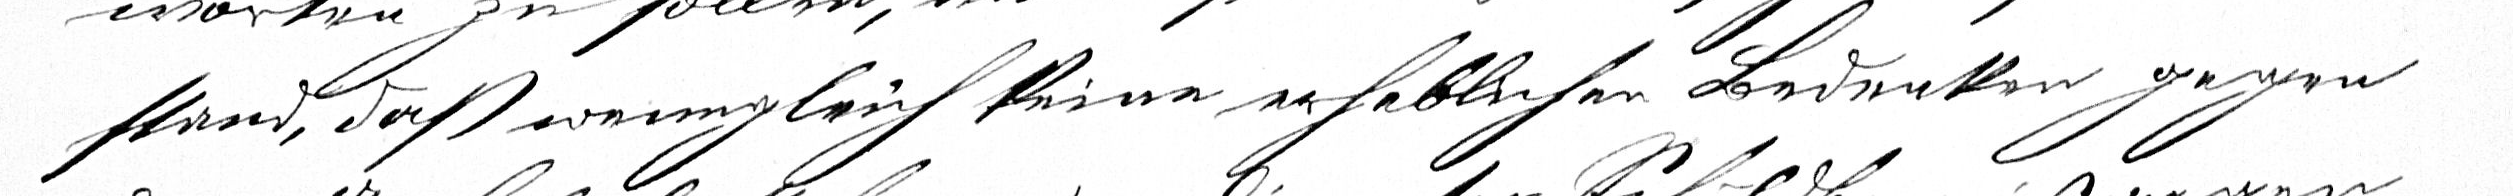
stand, daß wenngleich keine erheblichen Bedenken gegen
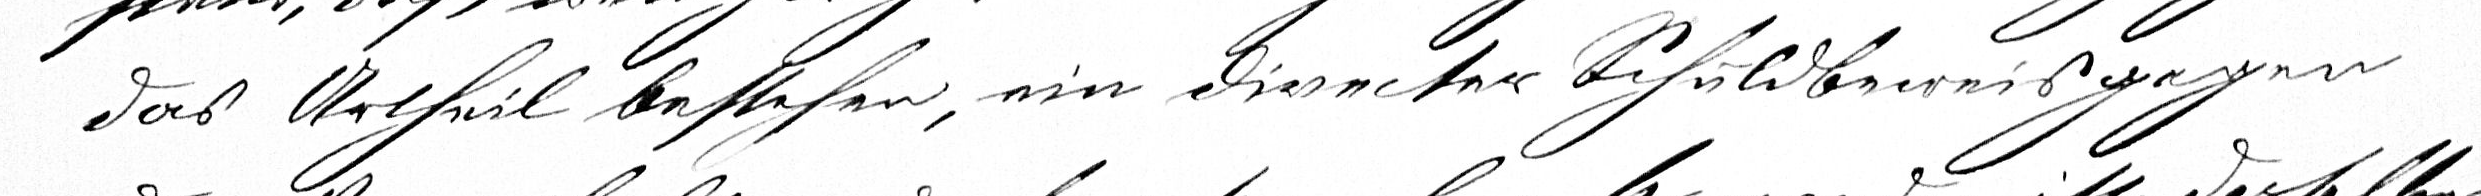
das Urtheil bestehen, ein Directer Schuldbeweis gegen
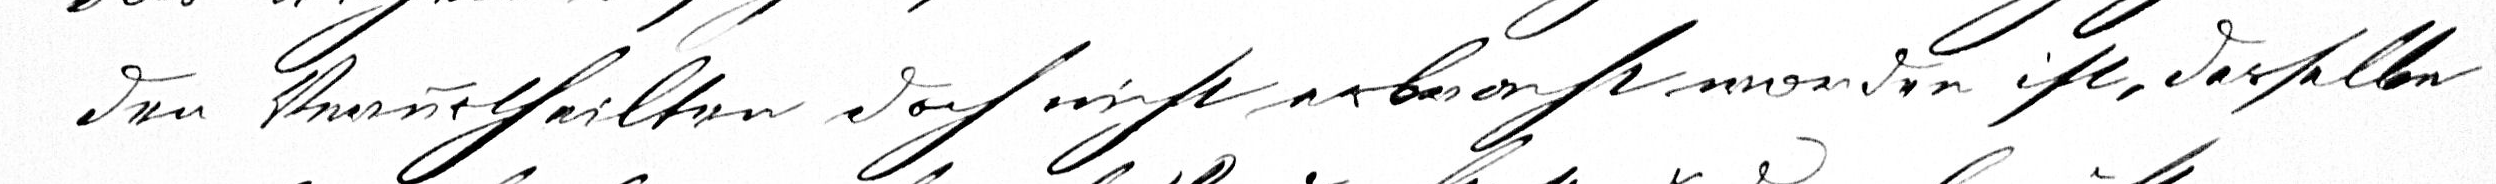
den Verurtheilten doch nicht erbracht worden ist, derselbe
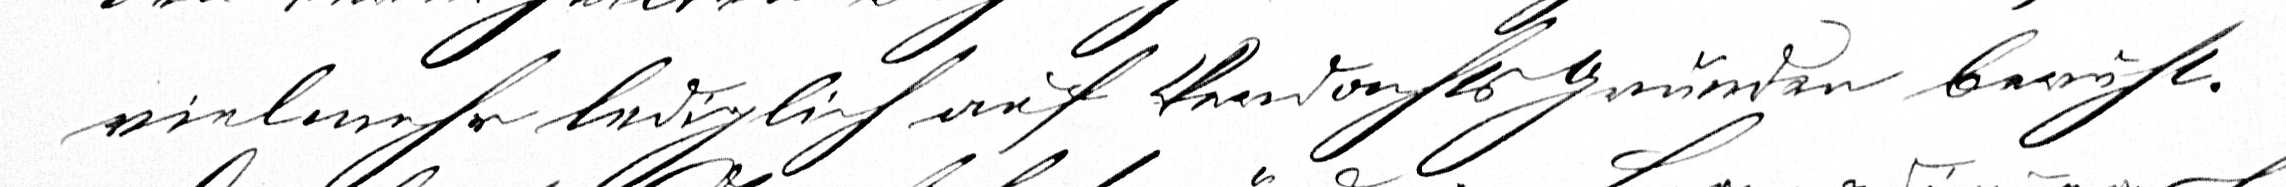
vielmehr lediglich auf Verdachts Grunden beruht.
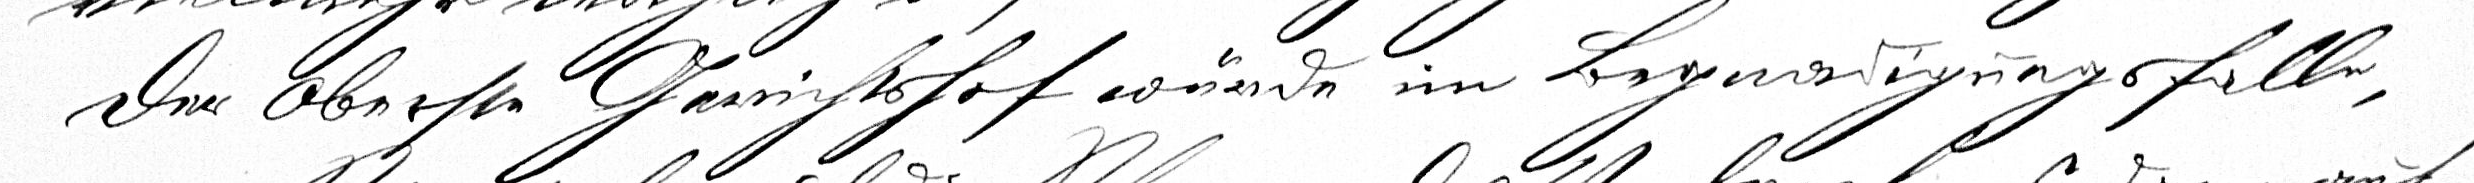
Der oberste Gerichtshof würde im Begnadigungsfalle,
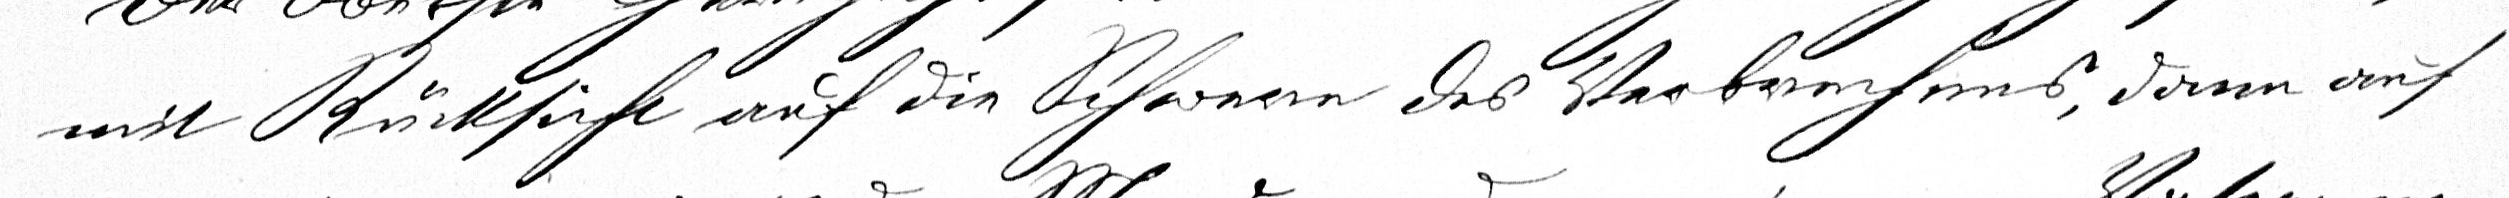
mit Rücksicht auf die Schwere des Verbrechens, dann auf
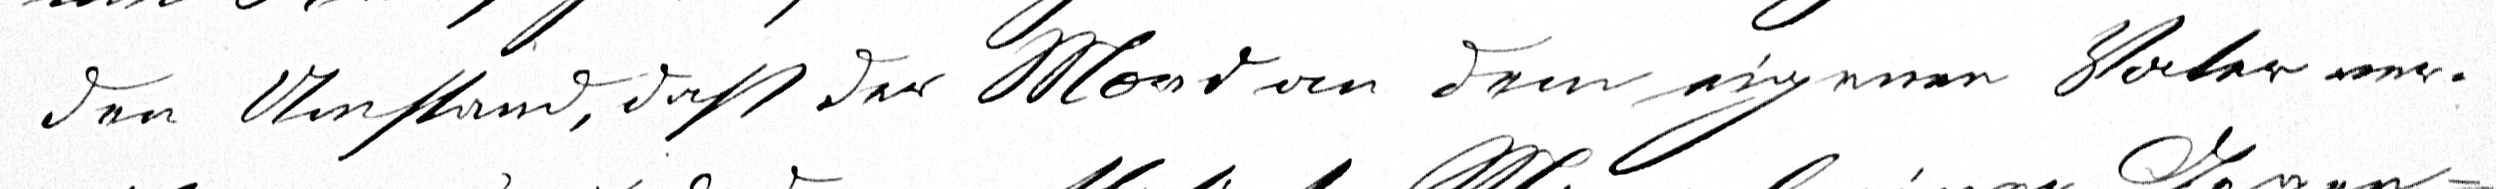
den Umstand, daß der Mord an dem eigenen Vater ver¬
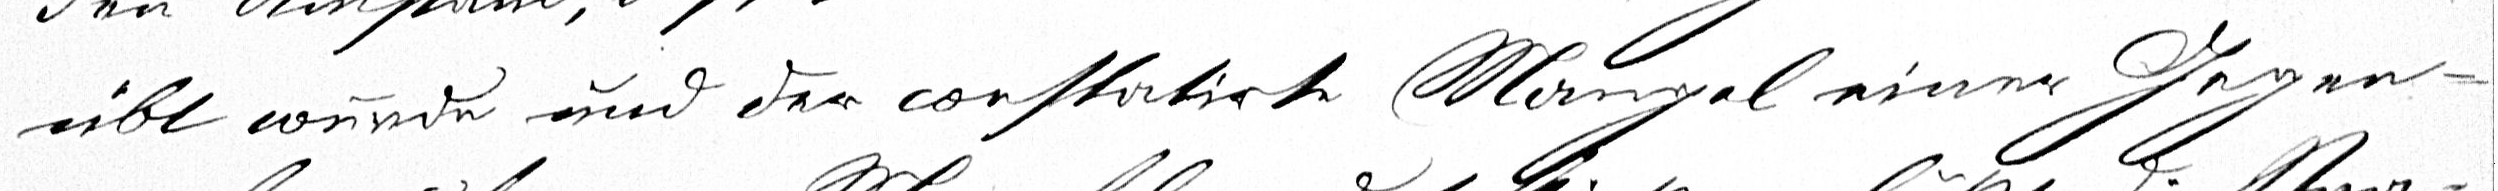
übt wurde und der constatirte Mangel einer Gegen¬
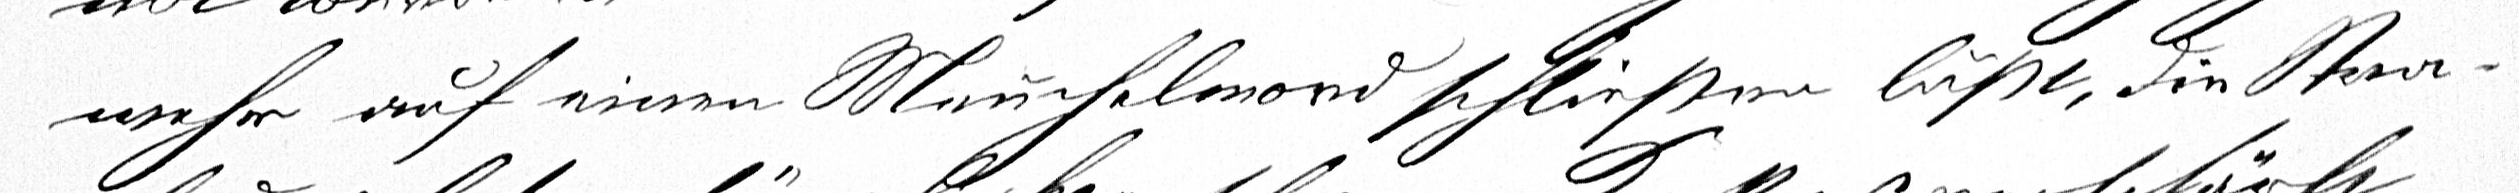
mehr auf einen Meuchelmord schließen läßt, die Stra¬
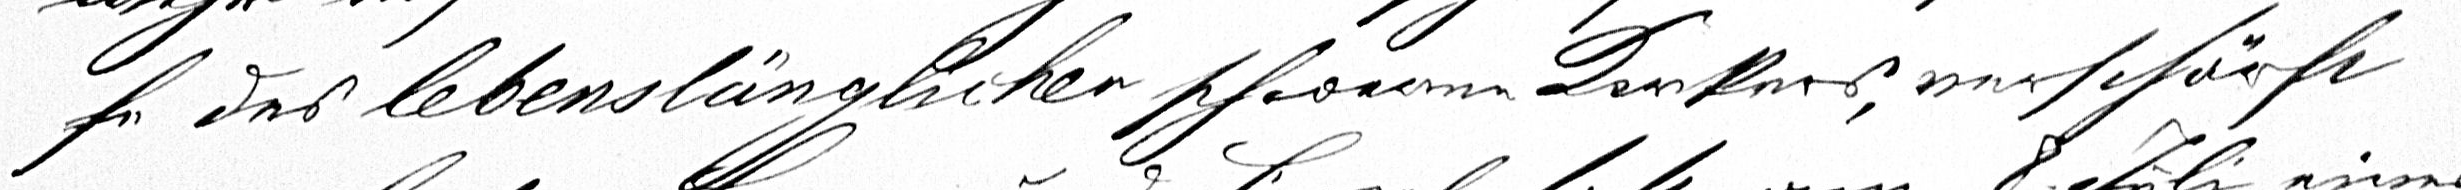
fe des lebenslänglicher schwerxx Kerkers, verschärft
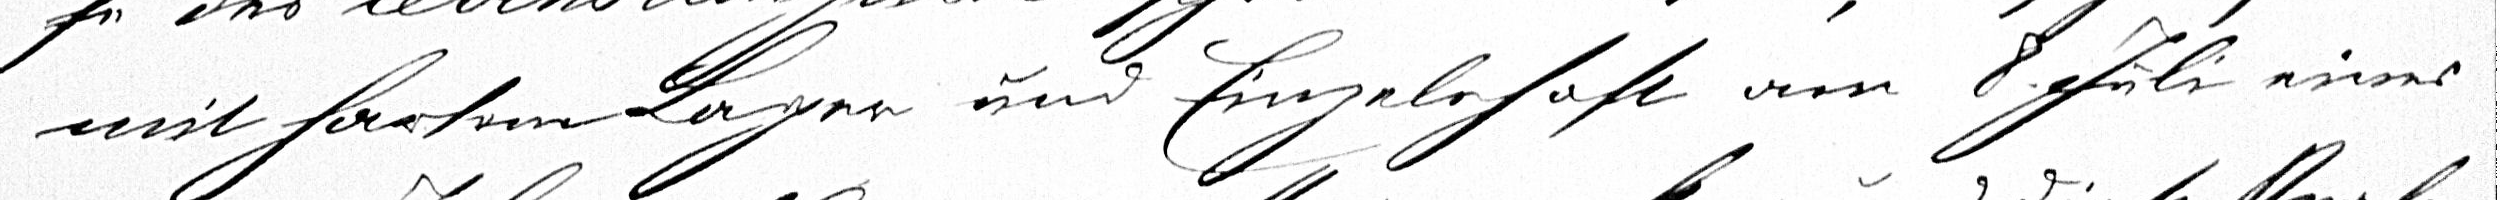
mit hartem Lager und Einzelschaft am 8. Juli eines
